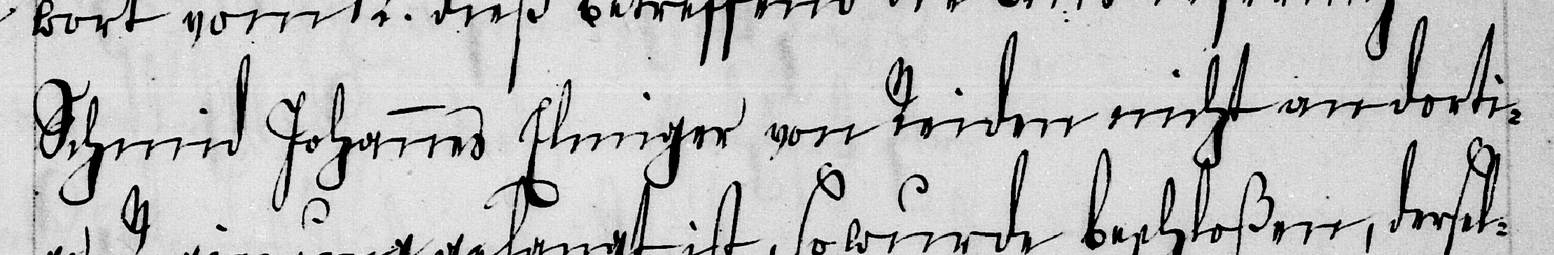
Schmid Johannes Elmiger von Reiden nicht an dorti¬
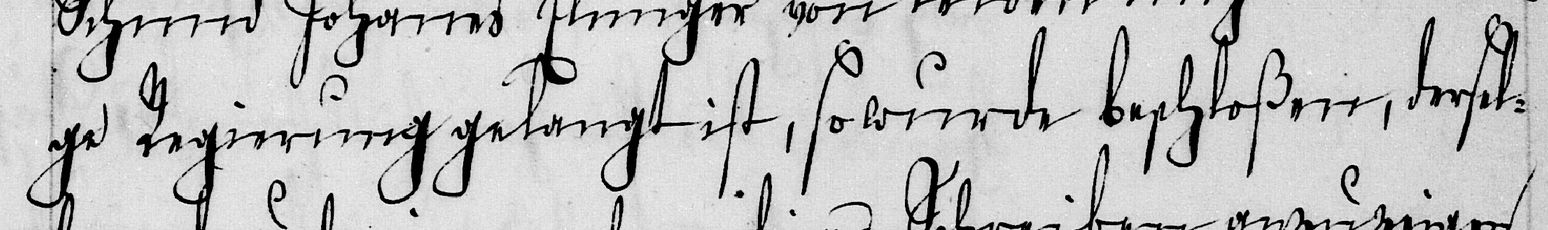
ge Regierung gelangt ist, so wurde beschloßen, dersel¬
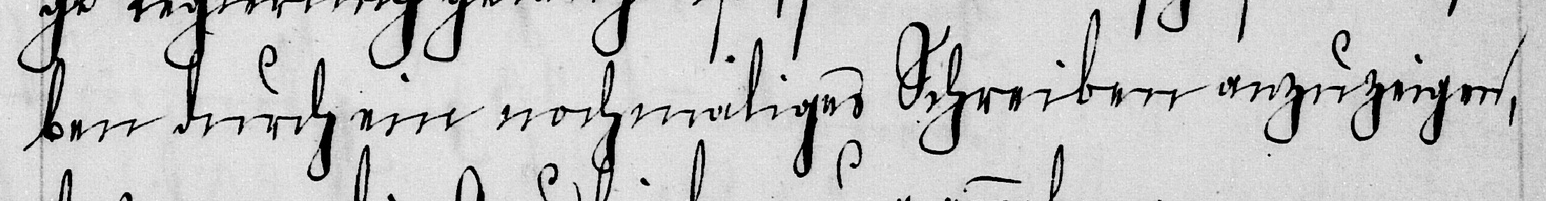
ben durch ein nochmaliges Schreiben anzuzeigen,
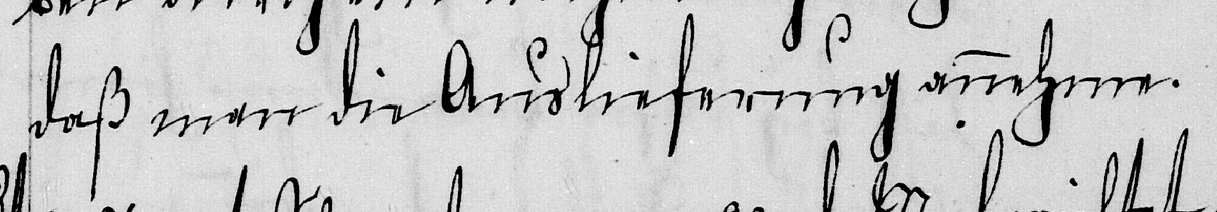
daß man die Auslieferung annehme.
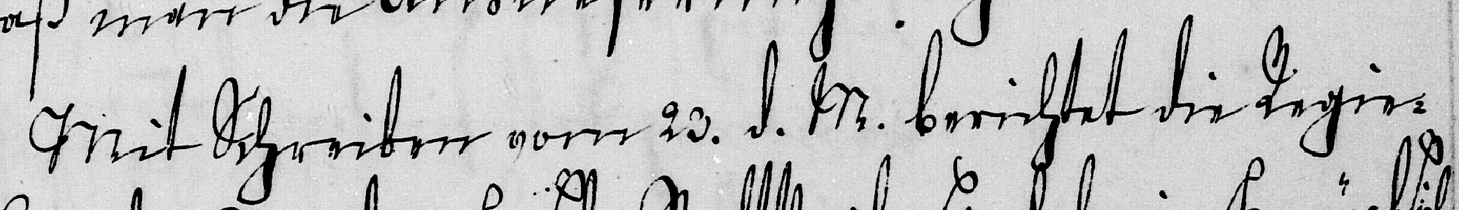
Mit Schreiben vom 23. d. M. berichtet die Regie¬
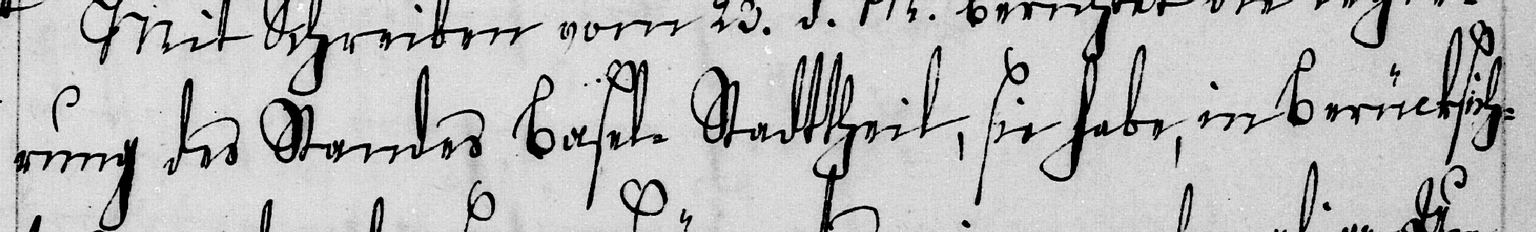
rung des Standes Basel-Stadttheil, sie habe, in Berücksic¬
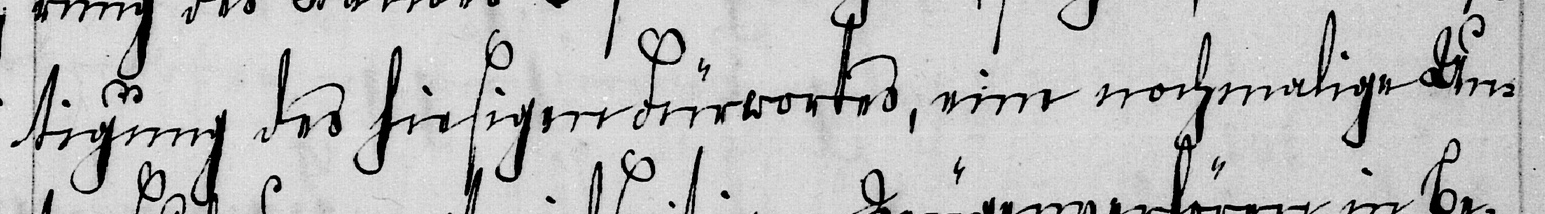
htigung des hiesigen Fürwortes, eine nochmalige Un¬
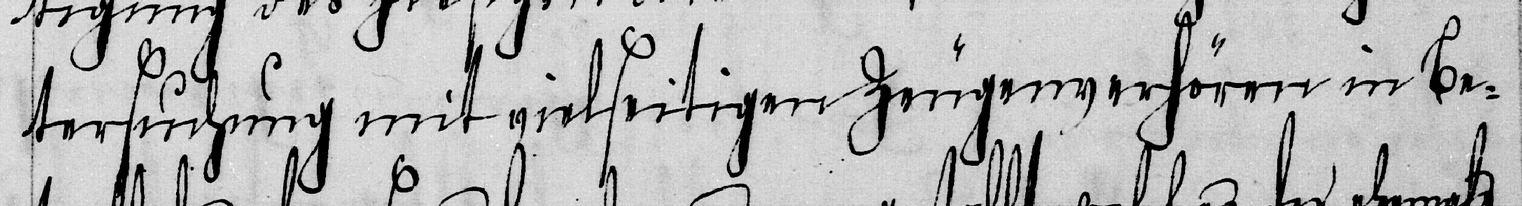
tersuchung mit vielseitigen Zeugenverhören in Be¬
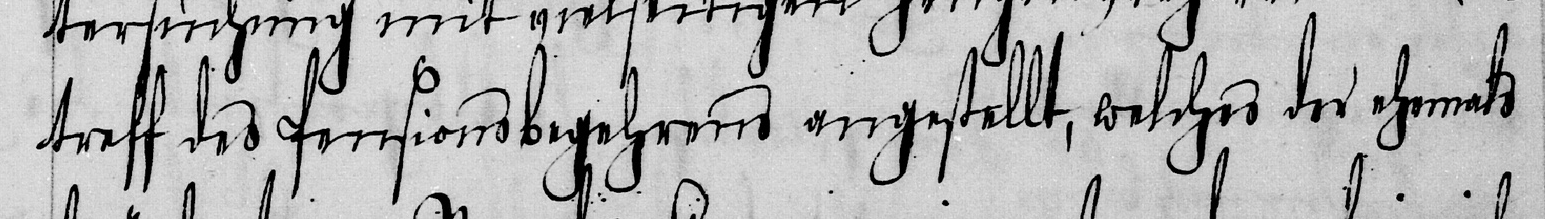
treff des Pensionsbegehrens angestellt, welches der ehemals
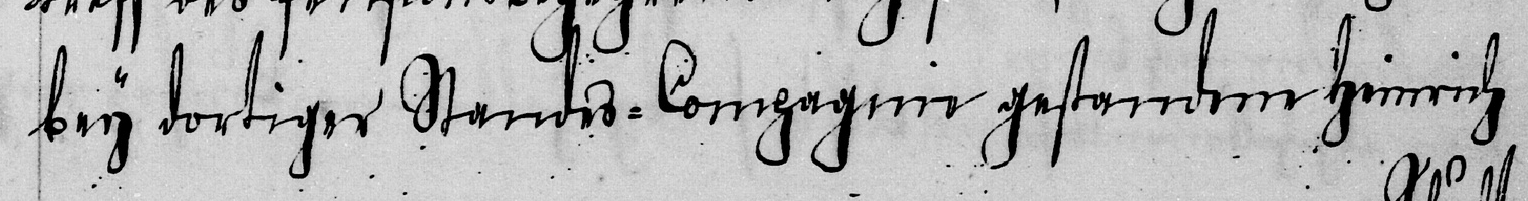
bey dortiger Standes-Compagnie gestandene Heinrich
